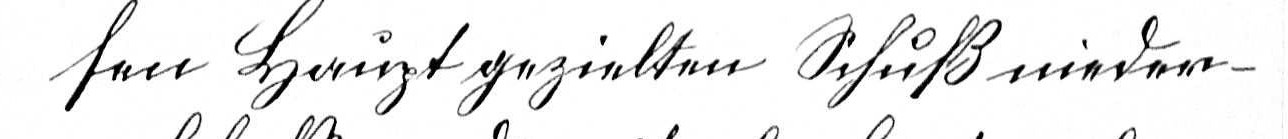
sen Haupt gezielten Schuß nieder¬
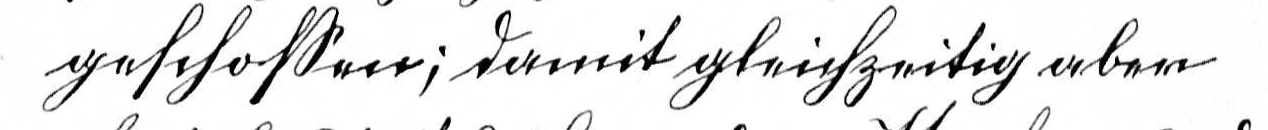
geschoßen; damit gleichzeitig aber,
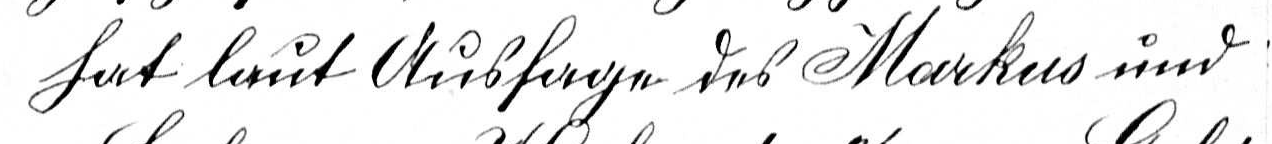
hat laut Aussage des Markus und
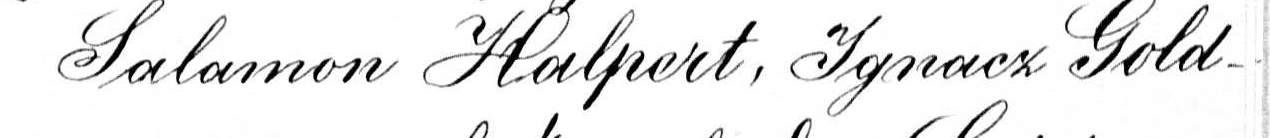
Salamon Halpert, Jgnacz Gold¬
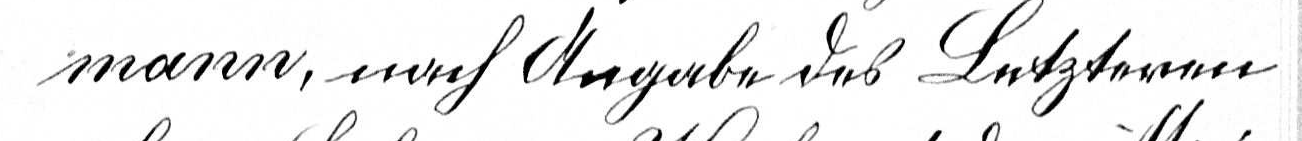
mann, nach Angabe des Letzteren
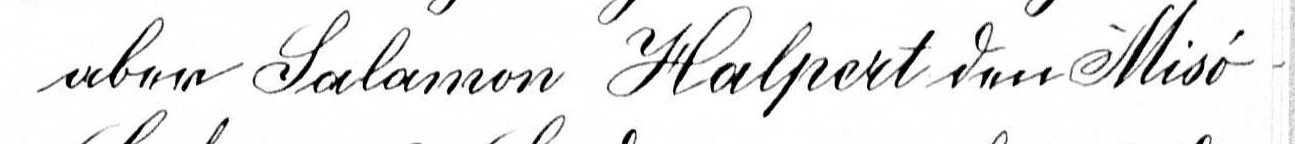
aber Salamon Halpert den Misó
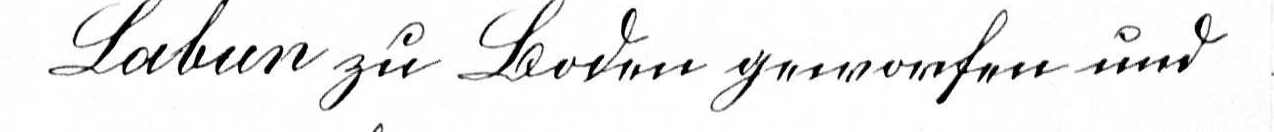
Labun zu Boden geworfen und
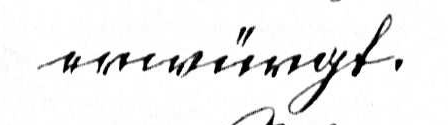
erwürgt.
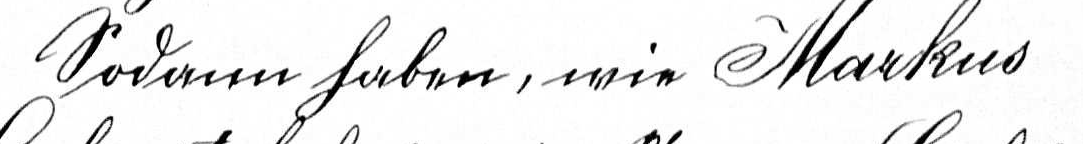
Sodann haben, wie Markus
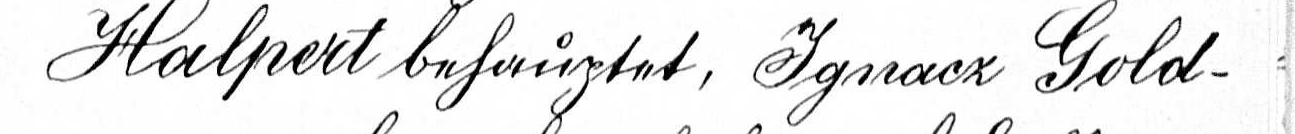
Halpert behauptet, Jgnacz Gold¬
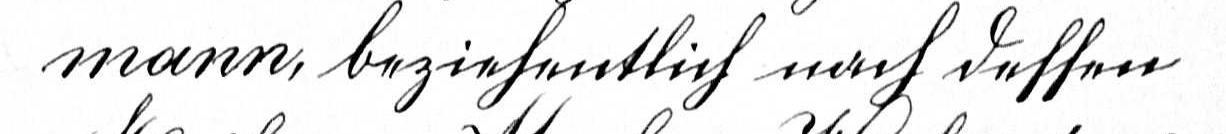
mann, beziehentlich nach dessen
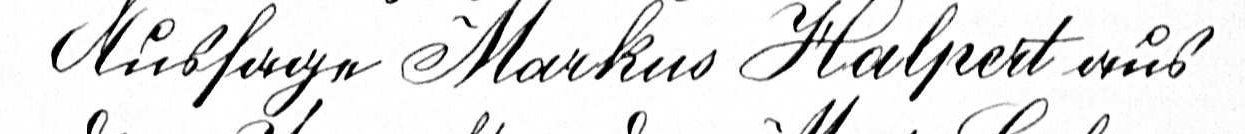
Aussage Markus Halpert aus
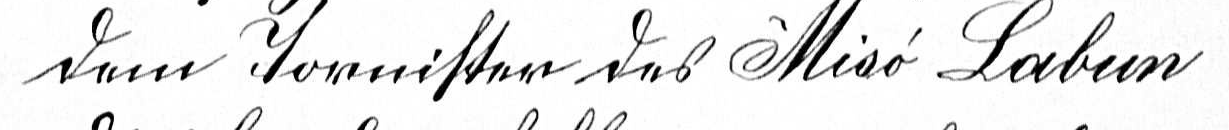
dem Tornister des Misó Labun
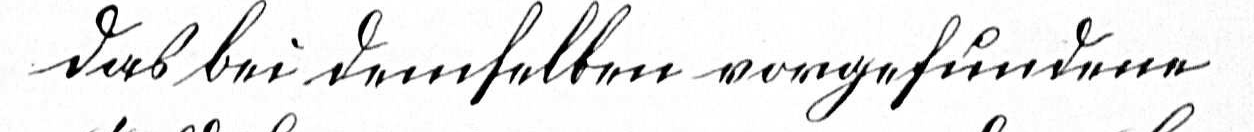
das bei demselben vorgefundene
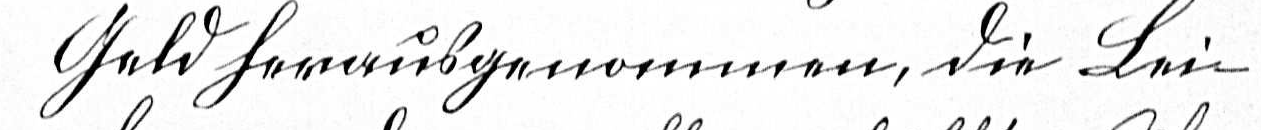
Geld herausgenommmen, die Lei¬
